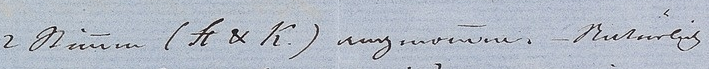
2 Stimmen (St & K.) angenommen. Natürlich
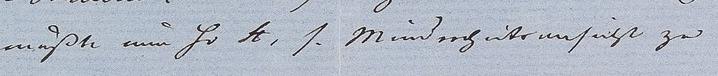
mußte nun Hr St. s. Minderheitsansicht zu
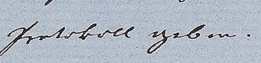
Protokoll geben.
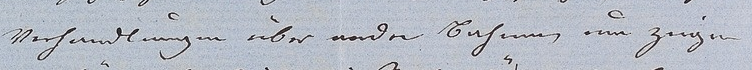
Verhandlungen über andre Bahnen, um zeigen
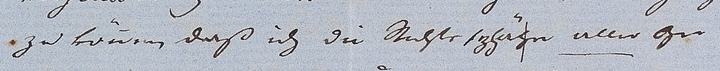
zu können, daß ich die Rechtssphähren aller Ge-
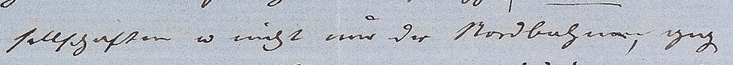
sellschaften u nicht nur der Nordbahnen, gegen
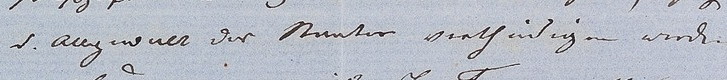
d. Allgewalt des Staates vertheidigen werde. –
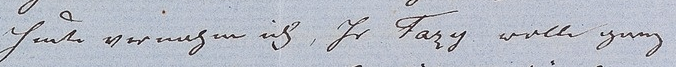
Heute vernahm ich, Hr Fazy wolle ganz
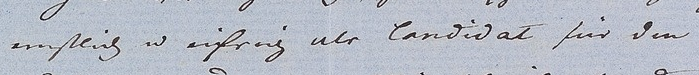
ernstlich u eifrig als Candidat für den
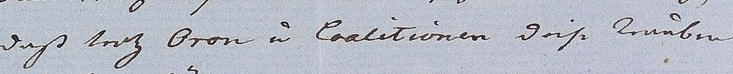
daß trotz Oron u Coalitionen diese Trauben
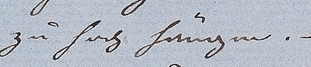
zu hoch hängen. –
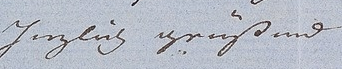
Herzlich grüßend
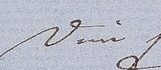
Dein
